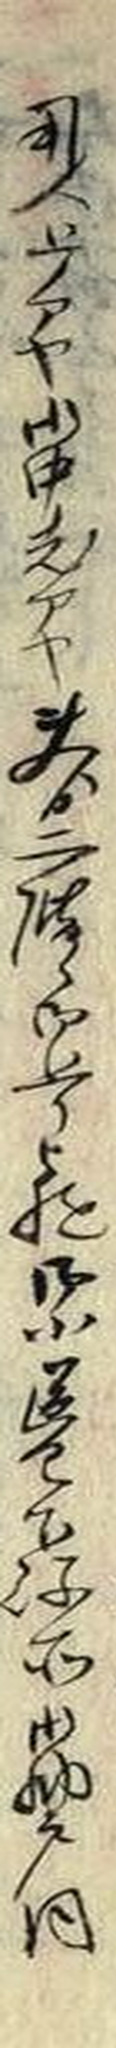用人上ノ部や御中老部や夫ゟ二階へ御上り被遊御小道具下役所御納戸同
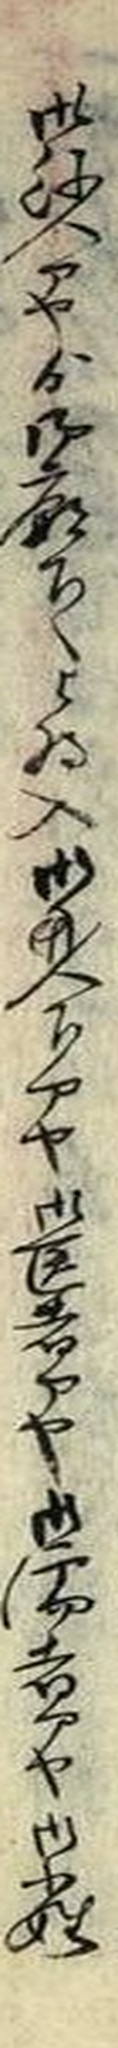御役人部やゟ御廊下へ被為入御用人下部や御医者部や御儒者部や御小姓
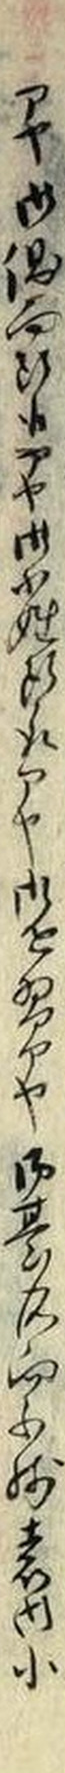部や御側向頭取部や御小姓頭取部や御近習部や御台所向不残表御小
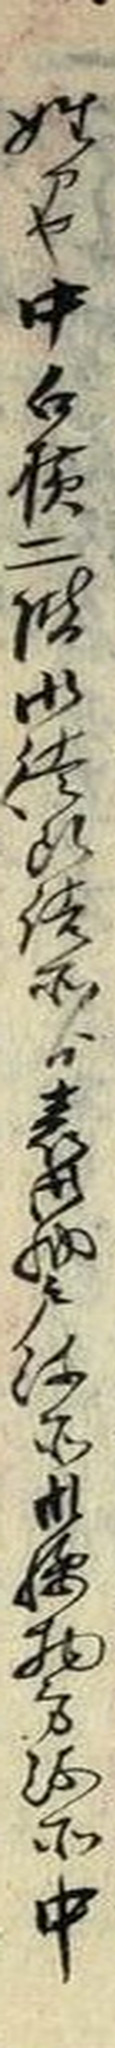姓部や中ノ口横二階御徒頭詰所ゟ表御納戸役所御腰物方役所中
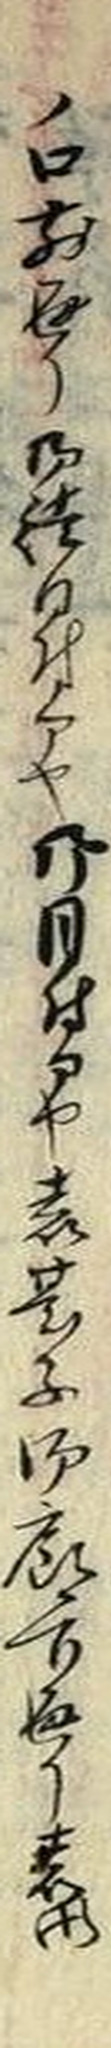ノ口前通り御徒目付部や御目付部や表台子御廊下通り表御
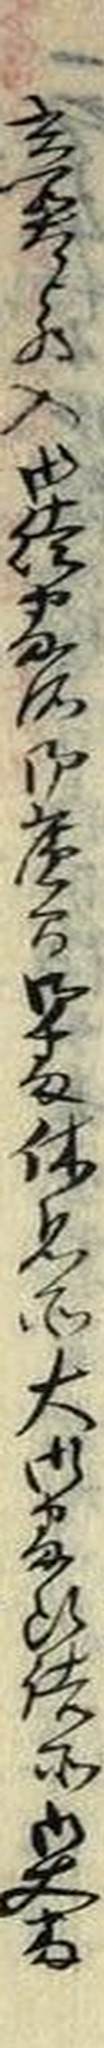玄関へ被為入御徒番所御広間御番休息所大御番詰所御使番
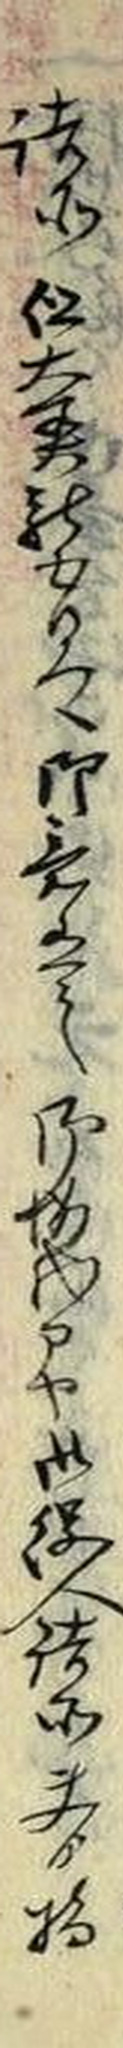詰所但大奥新五右衛門へ御意有之御城代部や御役人詰所夫ゟ指

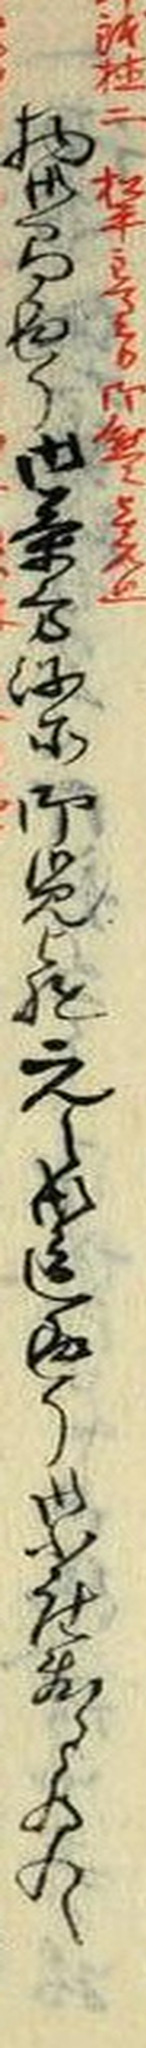物御間通り御茶方役所御覧被遊元之御道通り御小座敷へ被為入候
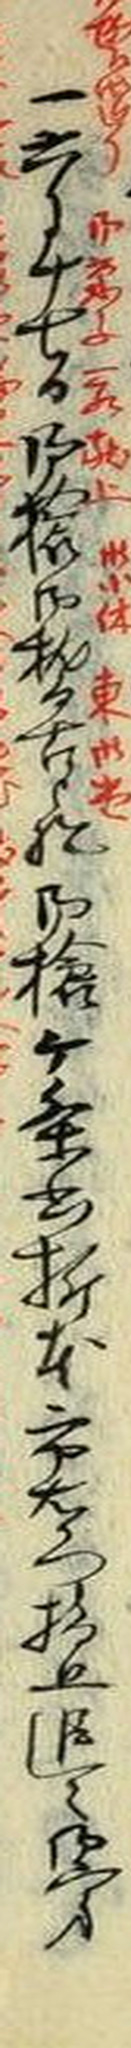一六月十七日御槍御稽古被遊御槍ケ条書折本市右衛門指上追々御穿
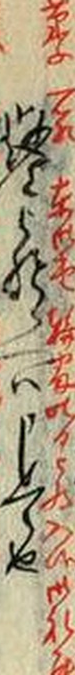鑿被遊候へハ申上候由
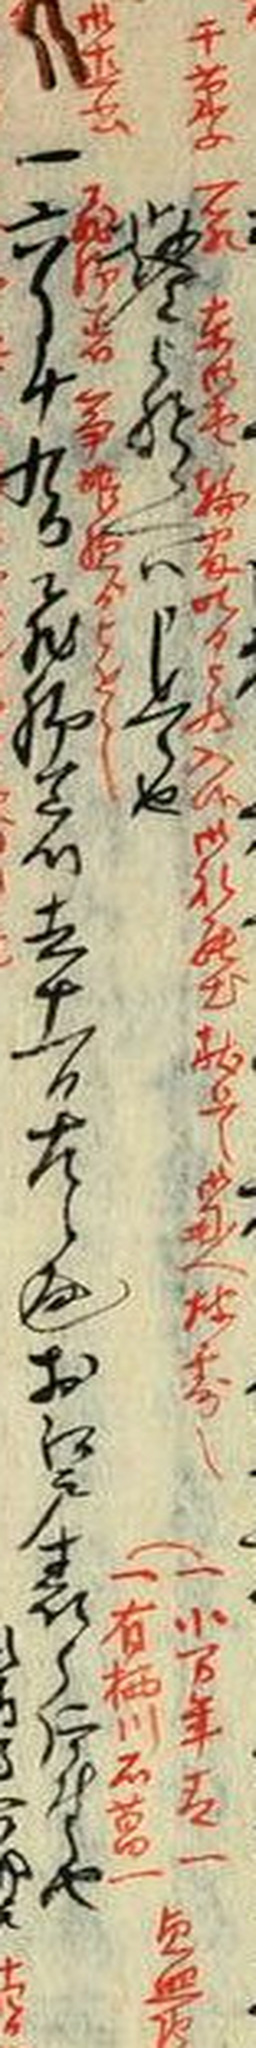一六月十九日飛脚着去十一日左之通於江戸表被仰付候由
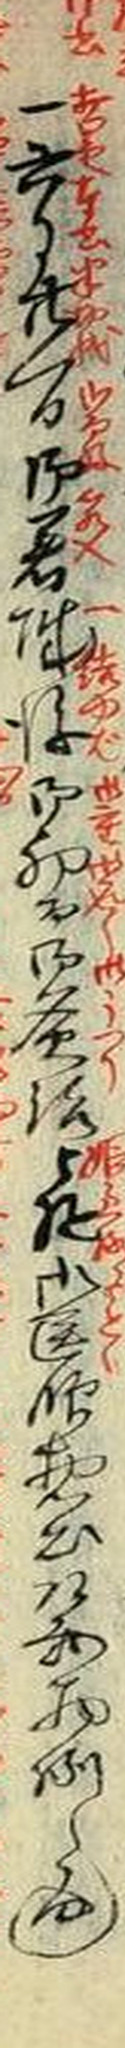一六月廿一日御着城後御初而御灸治被遊御医師惣出頂戴物例之通
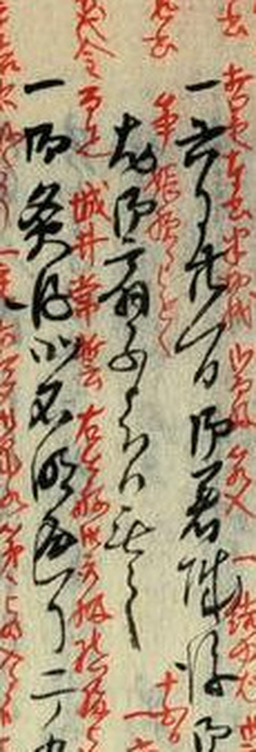尤御扇子被下ハ無之
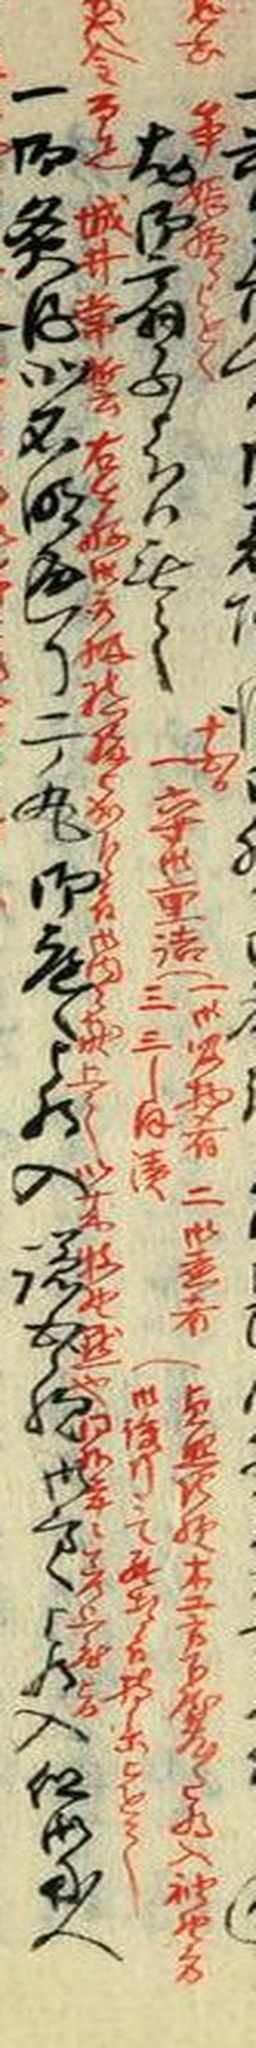一御灸後北不明通り二ノ丸御庭へ被為入謙五郎様御方へ被為入但御用人
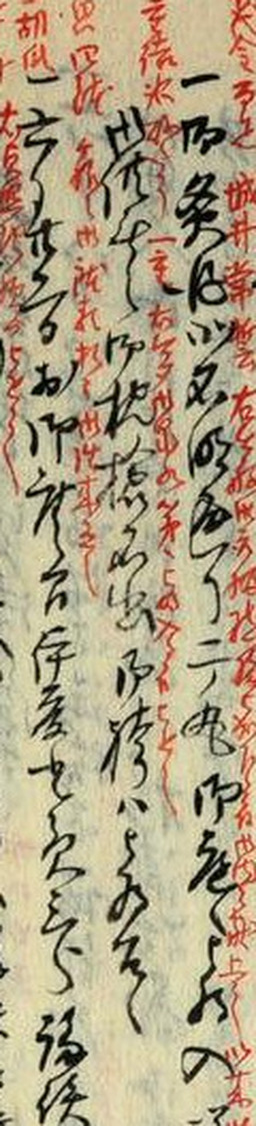御供無之御枕槍不出御袴ハ被為召候
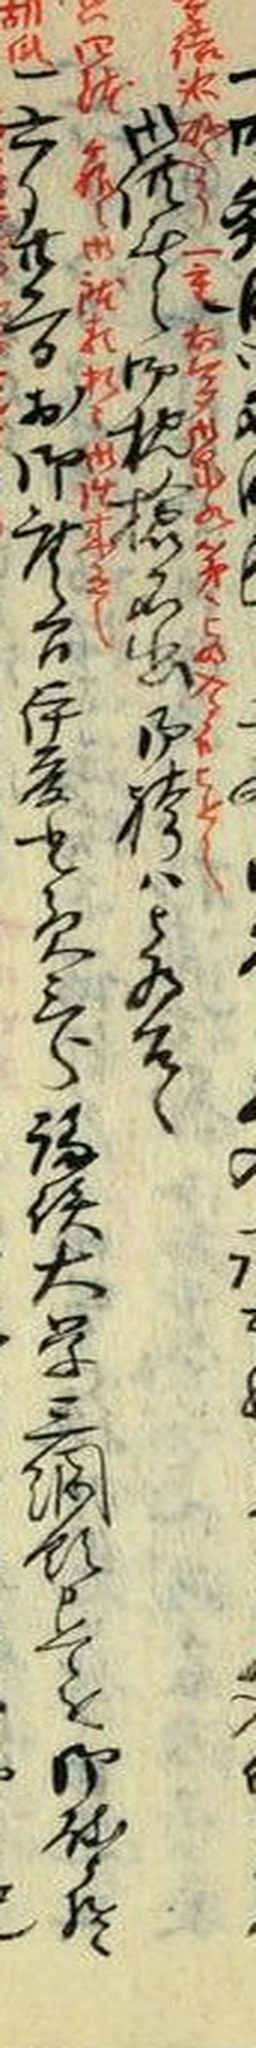一六月廿二日於御座之間伊藤登美三郎講談大学三綱領申上候を御聴被遊候
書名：少傅日録抄（斉承付側向頭取日記、在国）
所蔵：福井県文書館 Fukui Prefectural Archives
